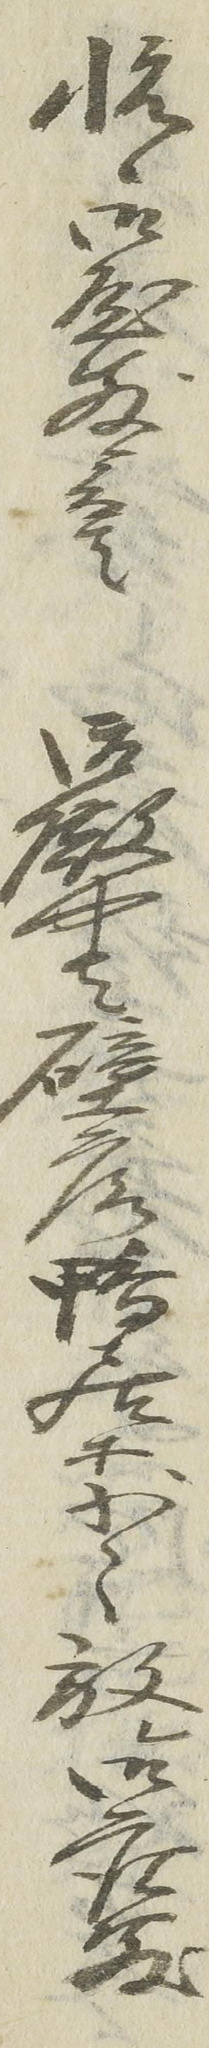悦候御屋敷ニても御殿中は壁落鴨居等少〻放レ御座敷
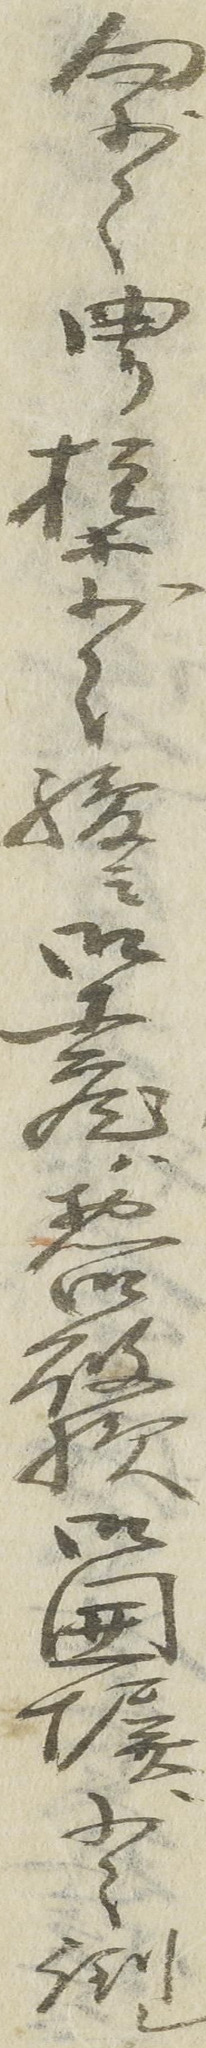向少し曲り柱等少し緩ミ御土蔵は惣御破損御囲塀少し倒レ
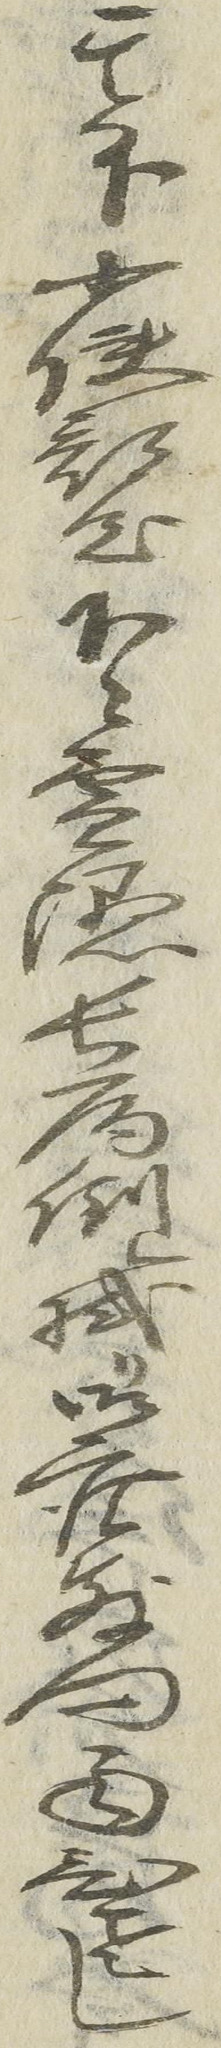其外小使部屋下之雪隠長局倒レ掛り御座敷向まひをし
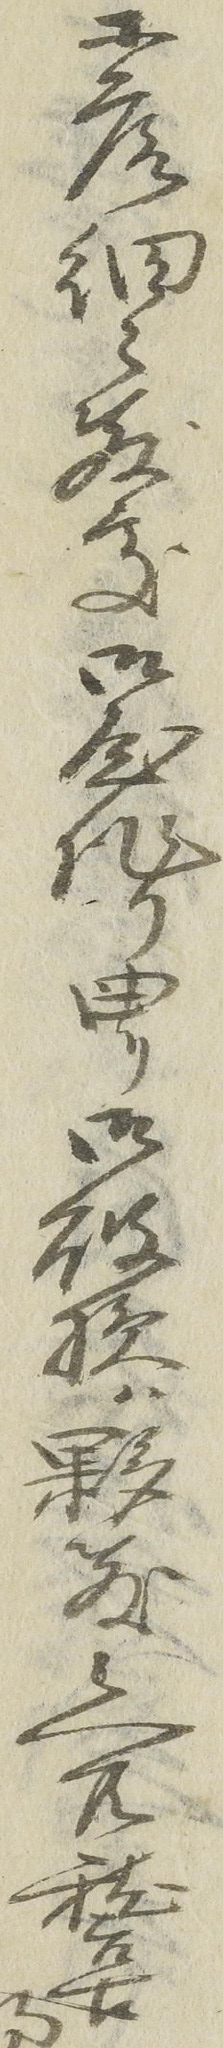等落細〻敷処御屋作り曲り御破損ハ夥敷候得共稽古場

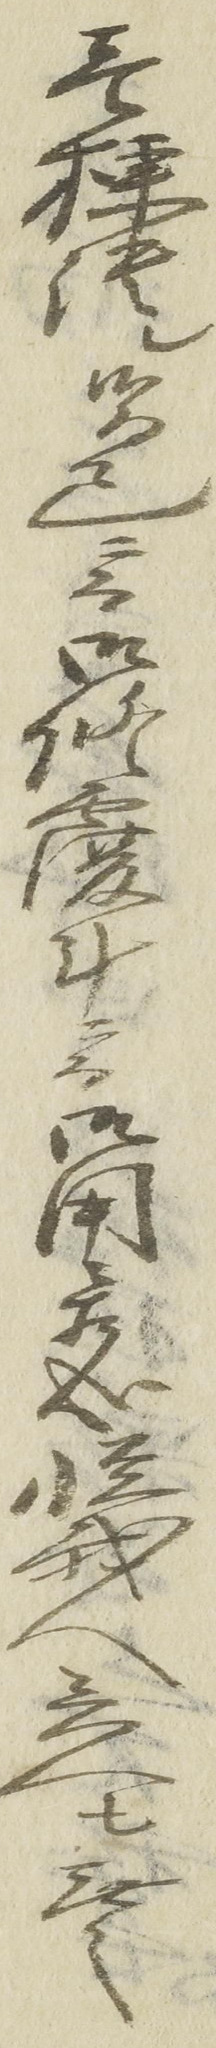壱棟潰レ候而己ニ而御修覆計ニ而御用ニ相成怪我人壱人も無之
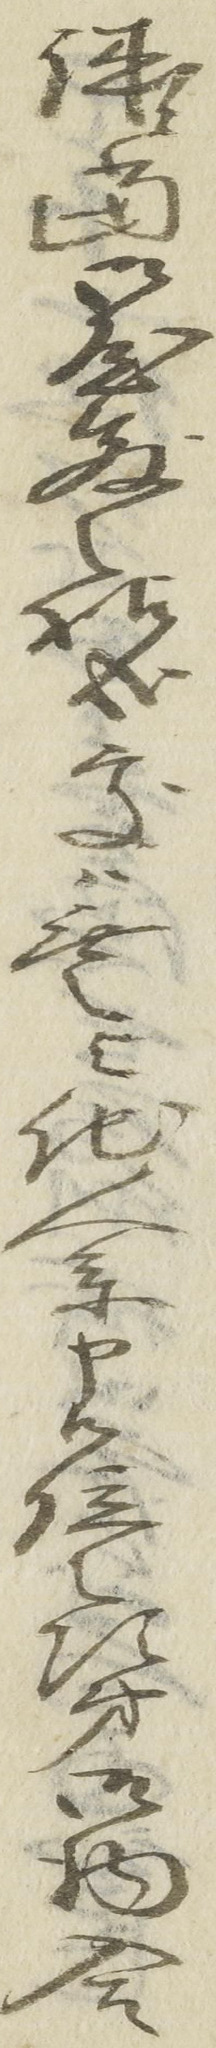誠ニ当御屋敷之様成処ハ無之と他人参申候位之次第御物入は
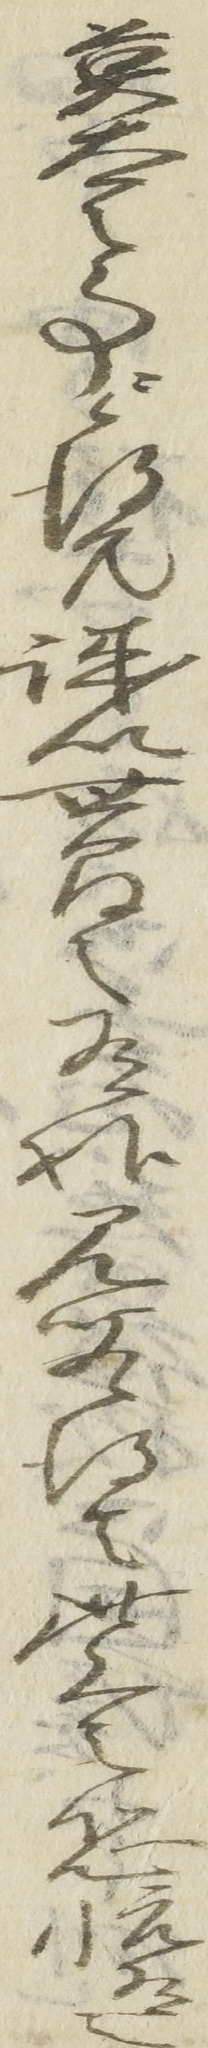莫太之事ニ候得共誠以世間之有様見聞候得は此上之恐悦有之
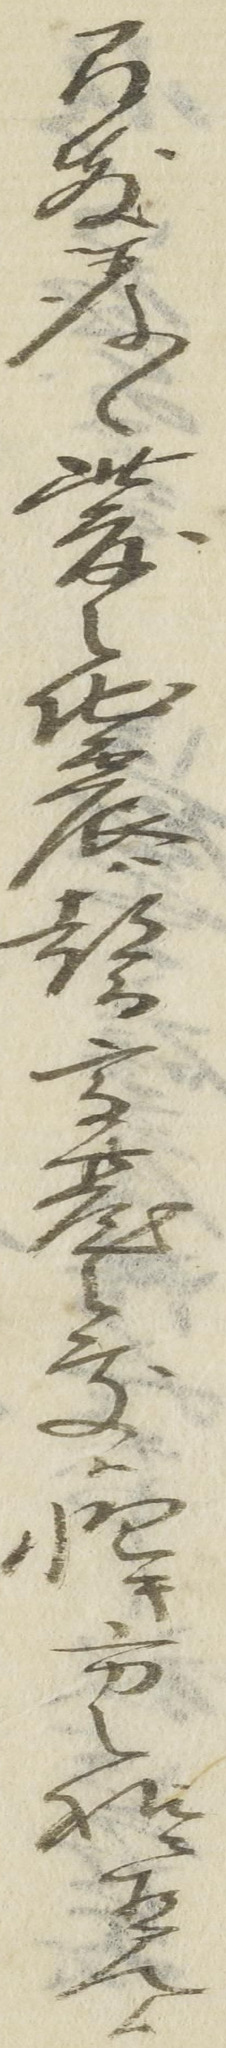間敷奉存候此度之地震ハ都而高台の所ハ軽キ方之様ニ相見候
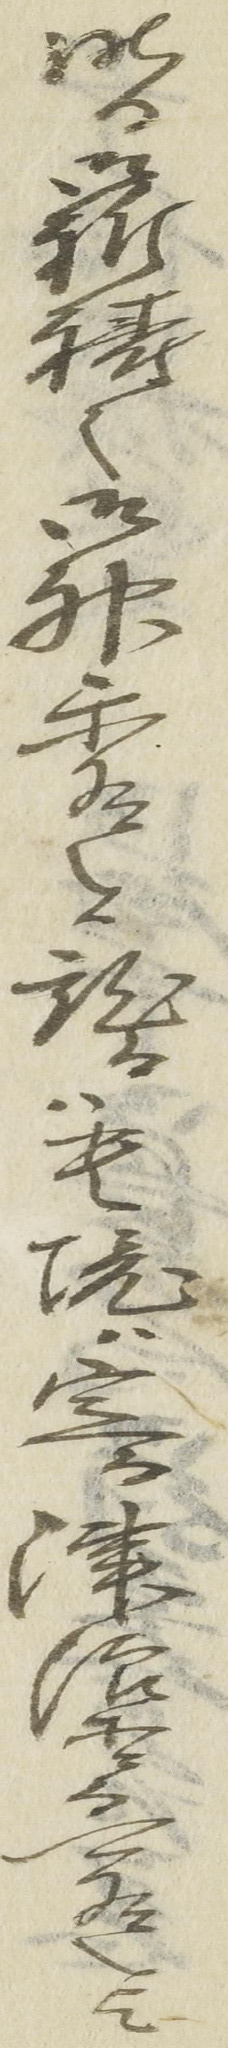昨日御祈祷之御神楽有之候就而ハ貴境ハ定而津波等ニ而可有之と
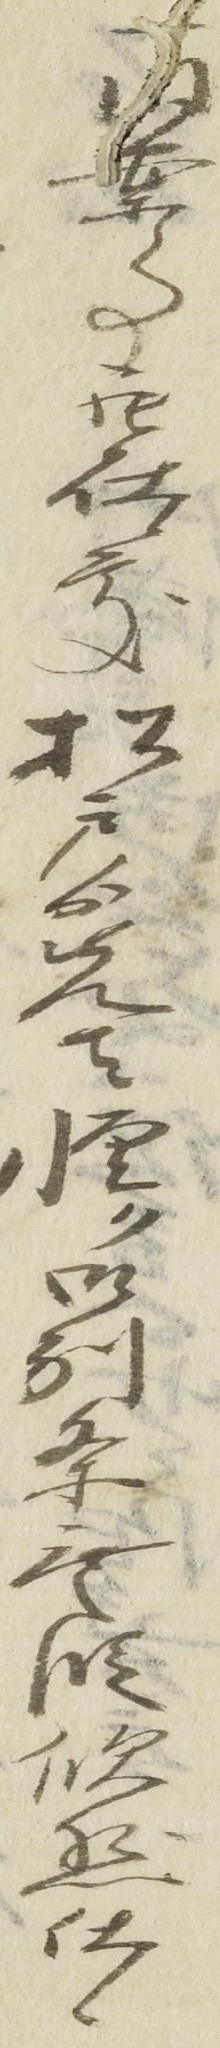一同案事被仕候処松戸ゟ先は軽ク御別条無段欣然仕候
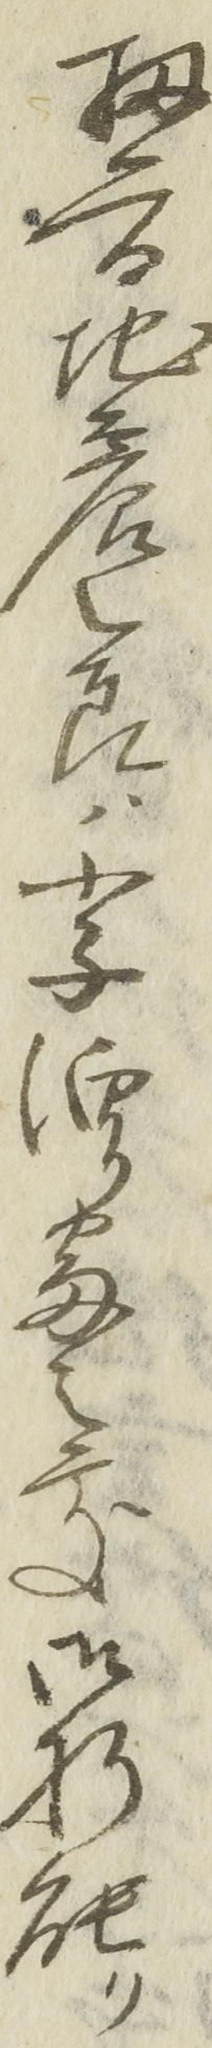扨二日地震之節は少子泊り番之処御折能ク
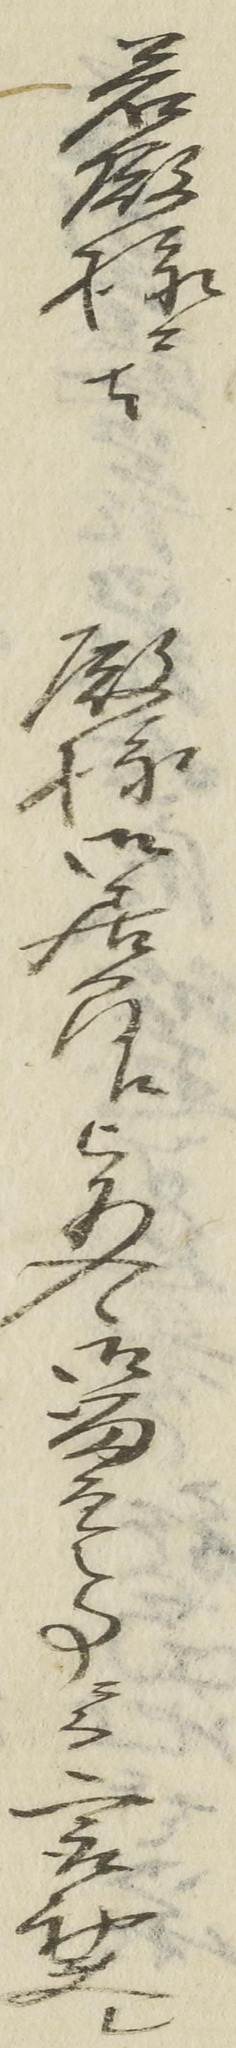若殿様ニは殿様御居間江被為入候御留主之事ニ而最初夫レ
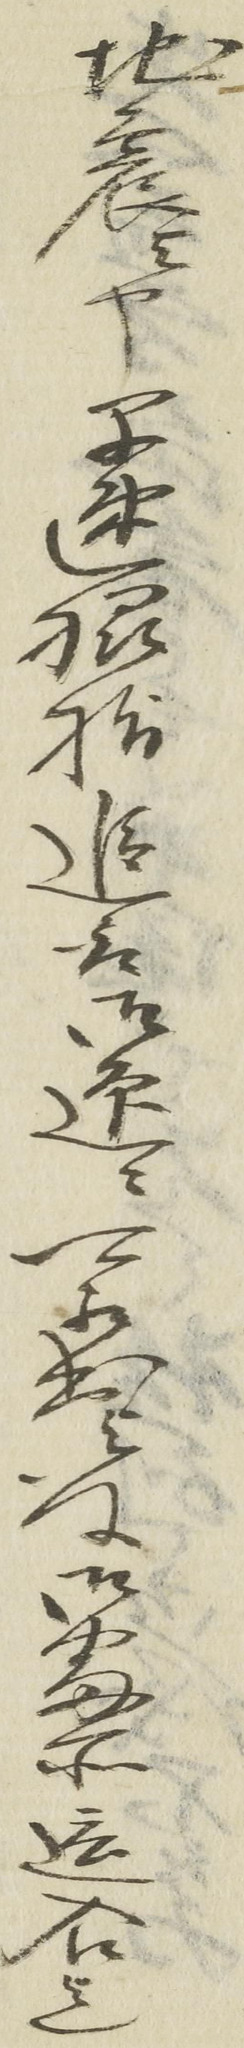地震と申早速脇指追取御迎ニ可相出と存御番所這入候迄
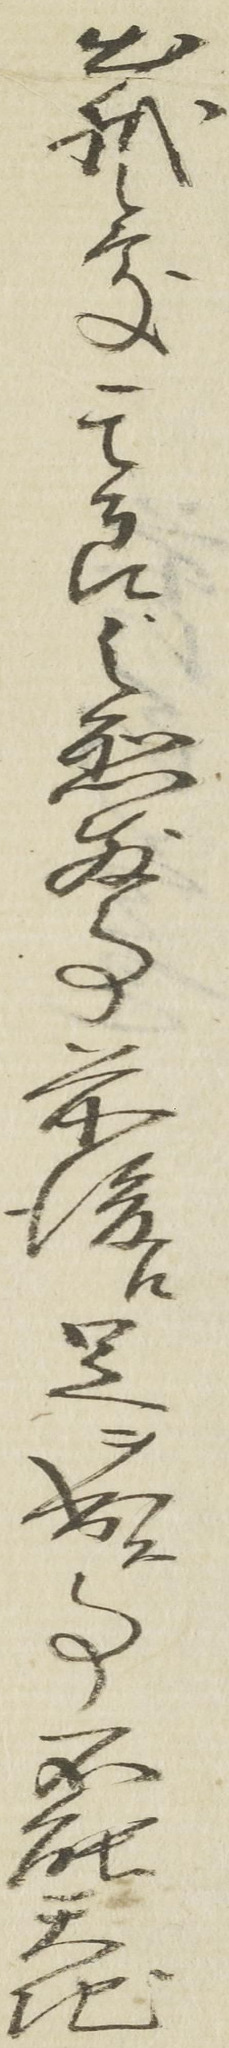出掛候処其節之烈敷事前後江足ヲ出ス事不能天地
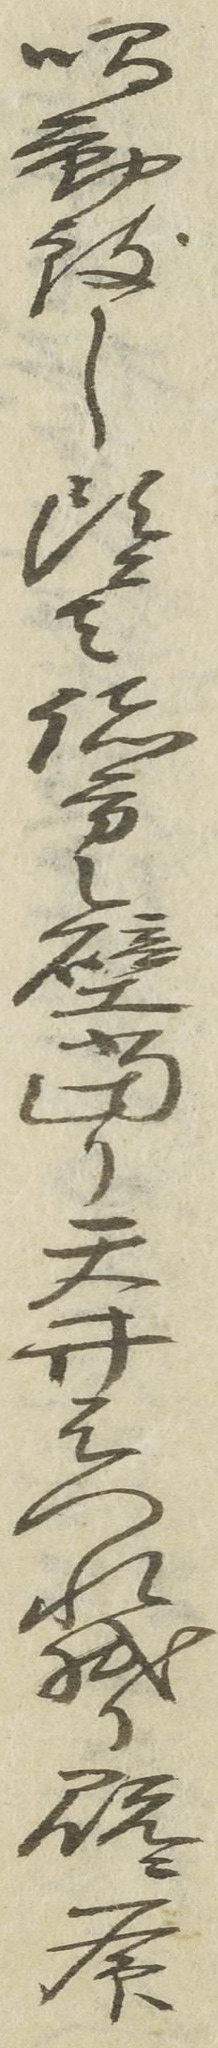鳴動いたし頭二は諸方之壁当り天井はつれ掛り既ニ一命
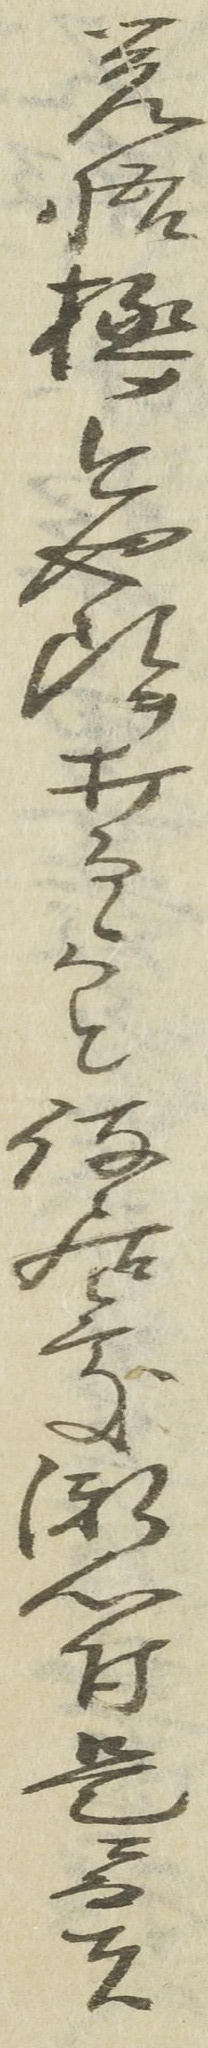覚悟極メ今や頭を打ち候かと住居候処漸心付是ニ而は
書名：安政乙卯江戸大地震筆記　安政丙辰八月大阪大雷雨之記追加　安政三辰年七月松前辺大地震并八月大風雨記録
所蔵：東京大学地震研究所図書室 Earthquake Research Institute Library, The University of Tokyo, JAPAN
